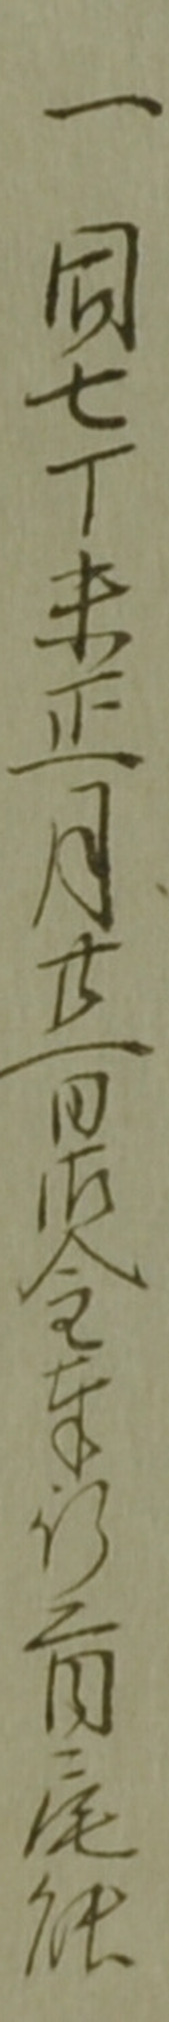一同七丁未正月廿一日御金奉行首尾能
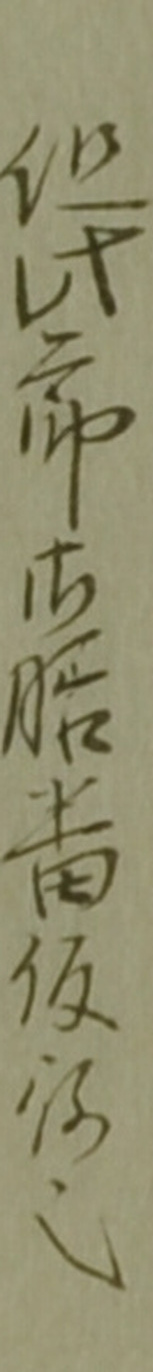但此節御膳番仮役也
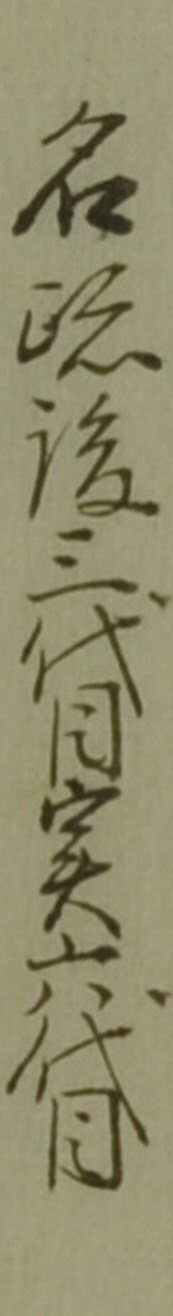名跡後三代目実六代目
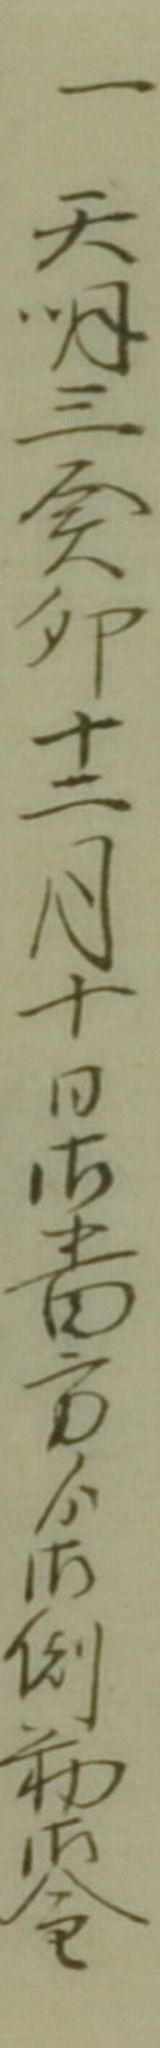一天明三癸卯十二月十日御番方ゟ御側勤御金
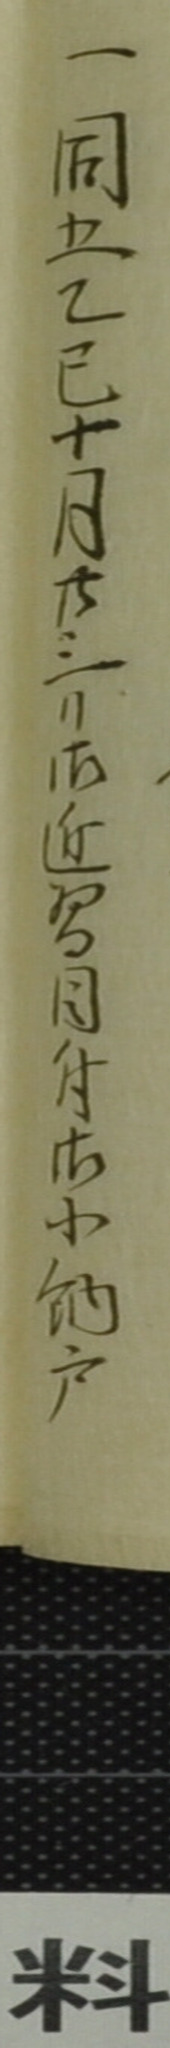一同五乙巳十月廿三日御近習目付御小納戸
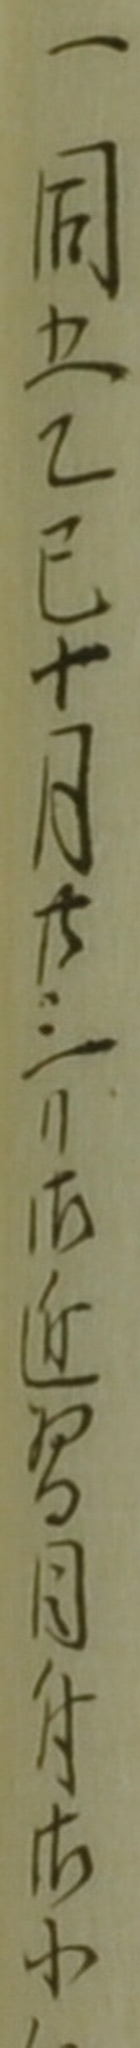一同五乙巳十月廿三日御近習目付御小納戸
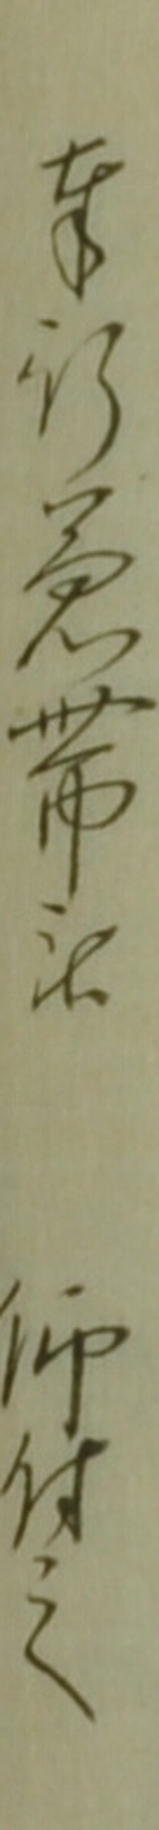奉行兼帯被仰付之
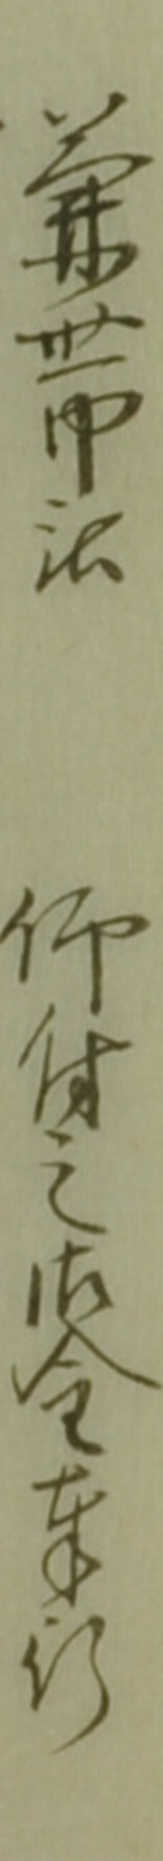兼帯被仰付之御金奉行
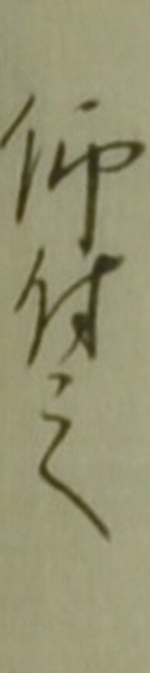仰付之
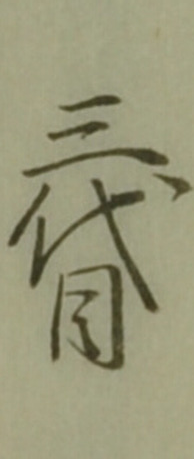三代目
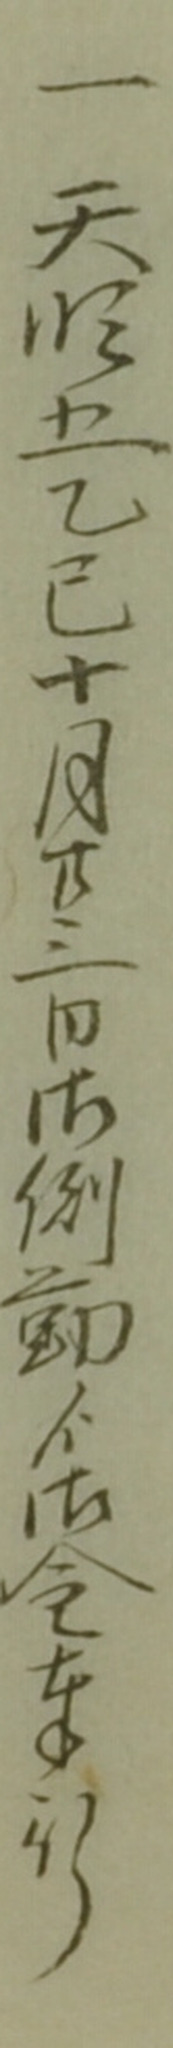一天明五乙巳十月廿三日御側勤ゟ御金奉行
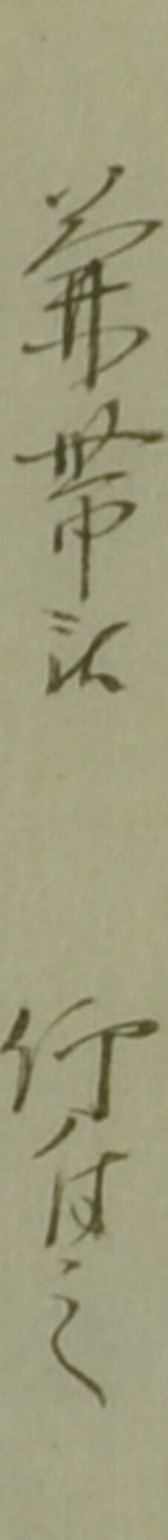兼帯被仰付之
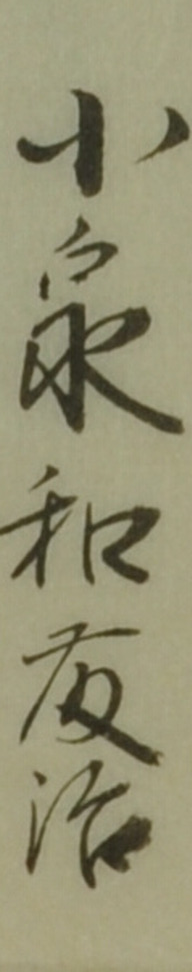小泉和藤治
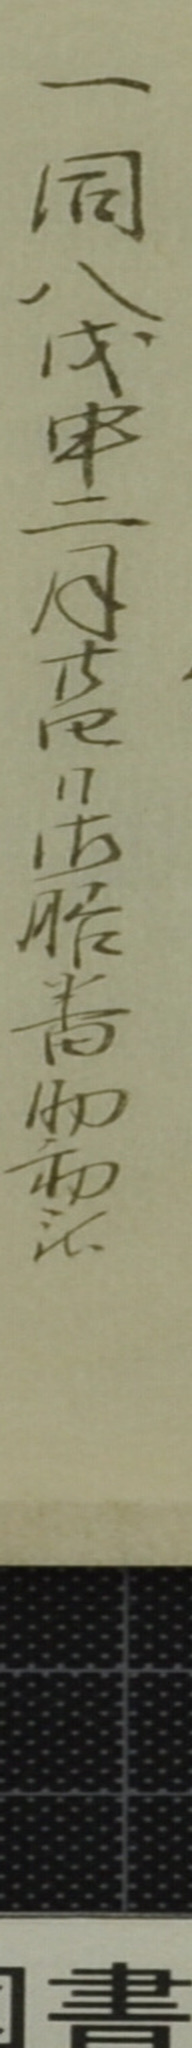一同八戊申二月廿四日御膳番助勤被
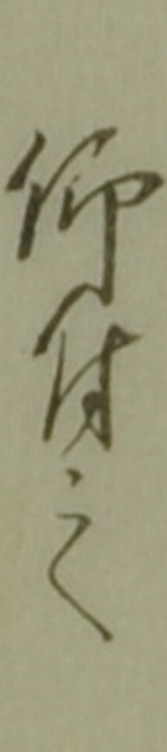仰付之
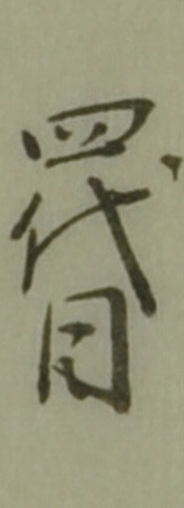四代目
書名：諸御役代々録（七）
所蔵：伊那市立高遠町図書館・合同会社AMANE
